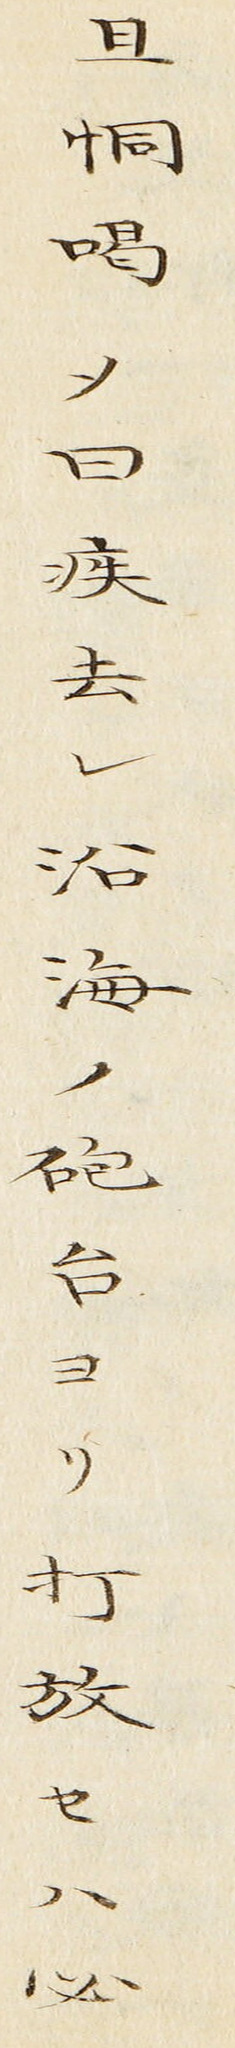且恫喝シテ曰疾去レ沿海ノ砲台ヨリ打放セハ必
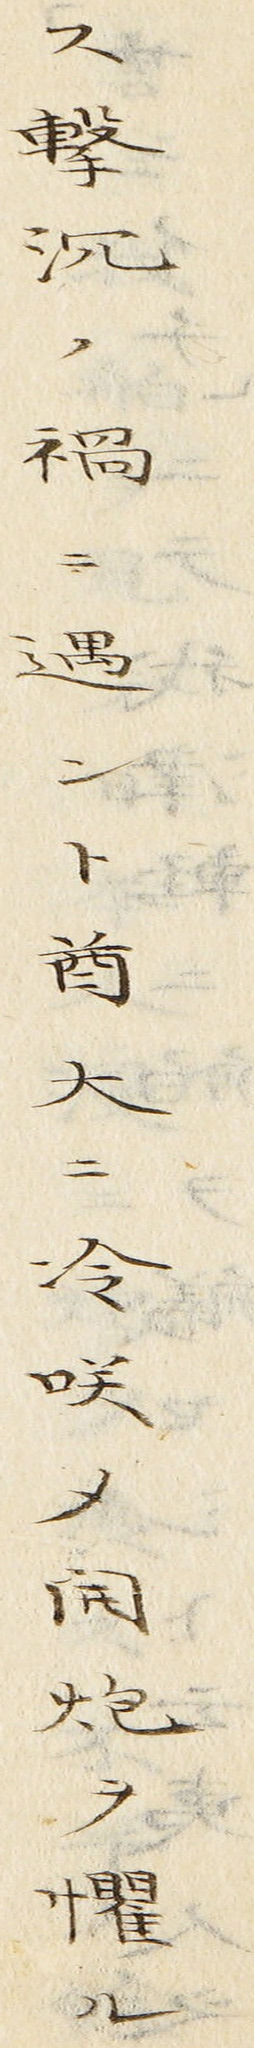ス撃沈ノ禍ニ遇ント酋大ニ冷咲シテ開炮ヲ懼ル
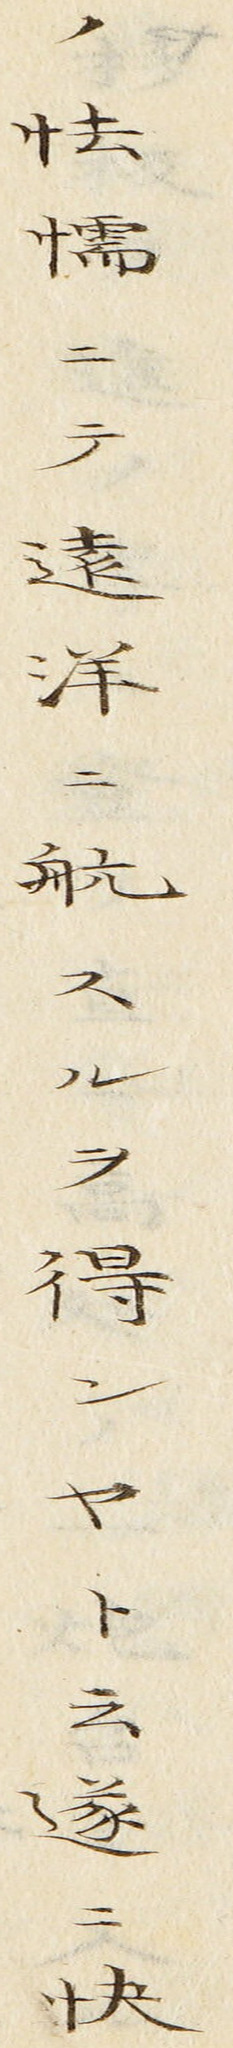ノ怯懦ニテ遠洋ニ航スルヲ得ンヤト云遂ニ快
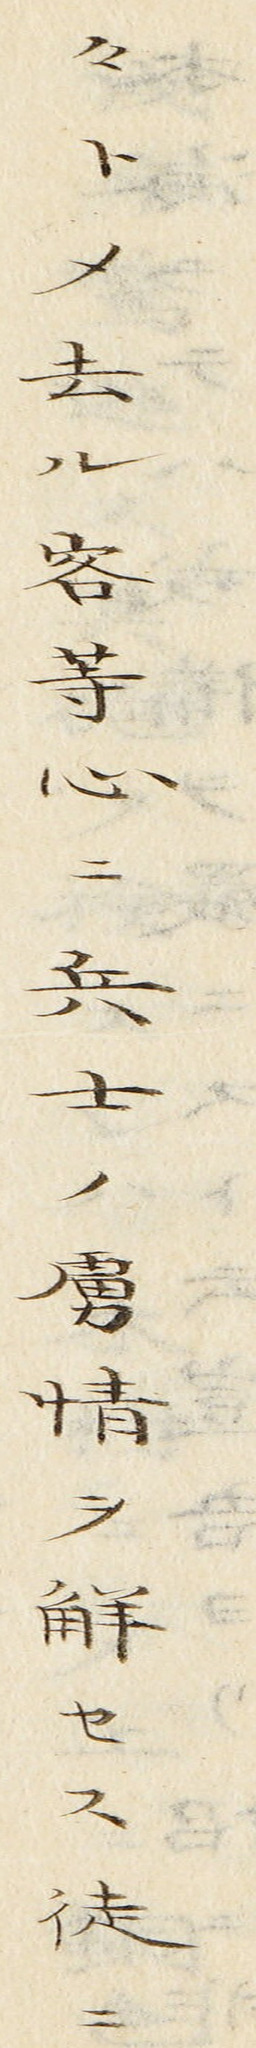々トシテ去ル客等心ニ兵士ノ虜情ヲ觧セス徒ニ
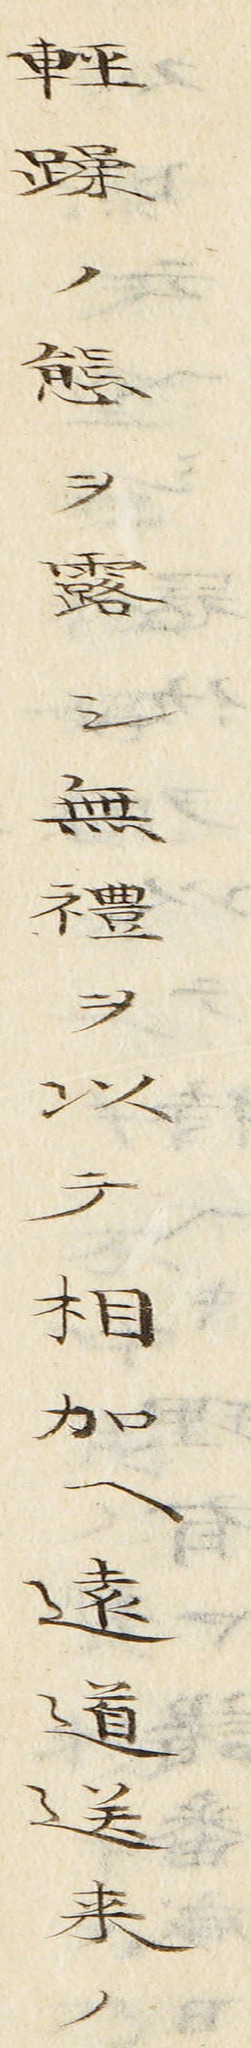軽躁ノ態ヲ露シ無禮ヲ以テ相加ヘ遠道送来ノ
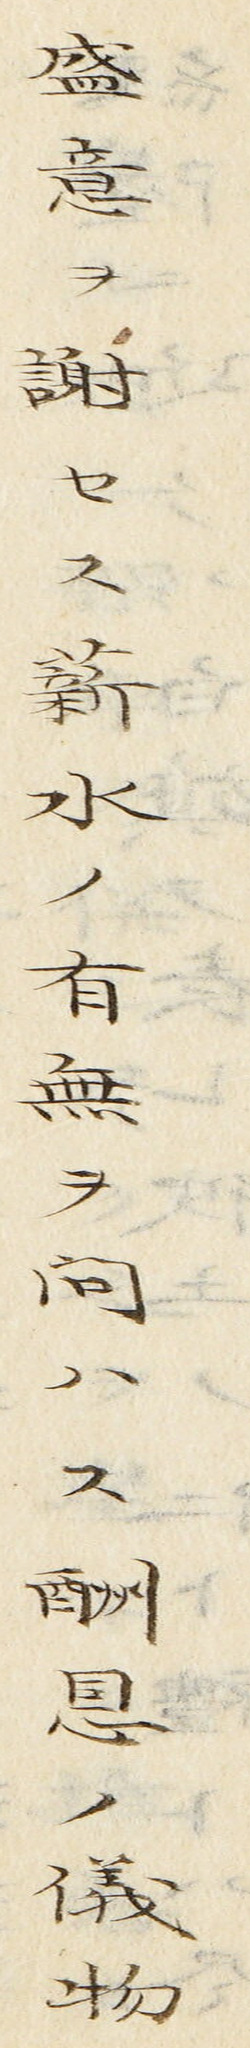盛意ヲ謝セス薪水ノ有無ヲ問ハス酬恩ノ儀物
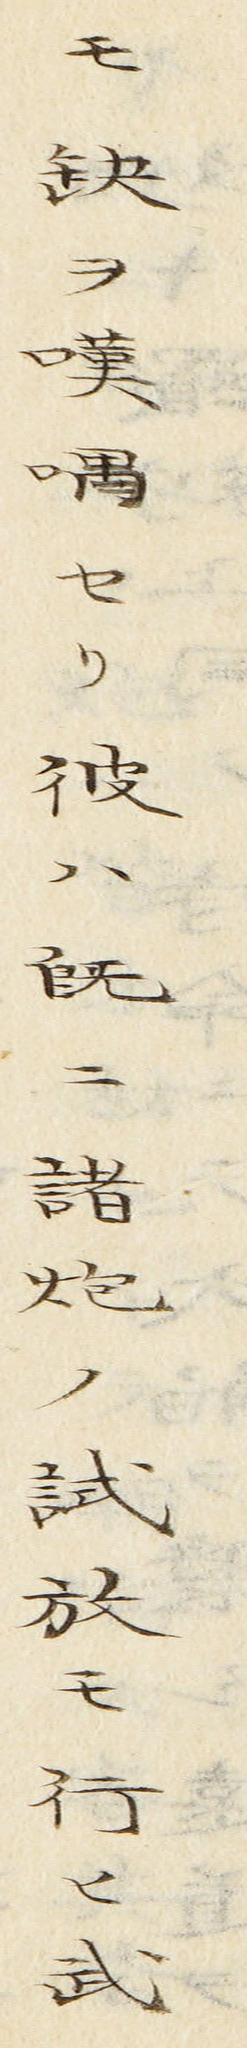モヲ嘆喁セリ彼ハ既ニ諸炮ノ試放モ行ヒ武
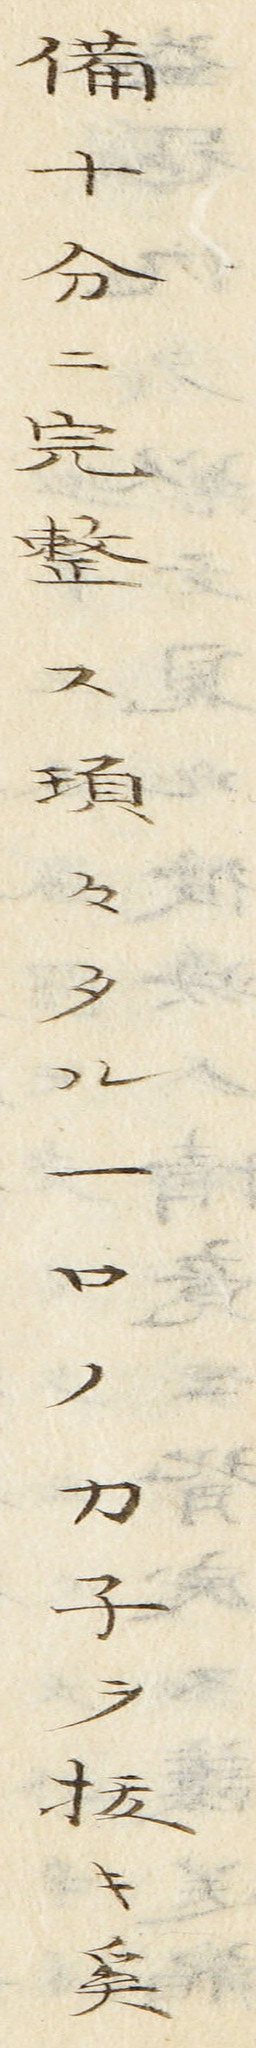備十分ニ完整ス頊々タル一口ノ刀子ヲ抜キ奚
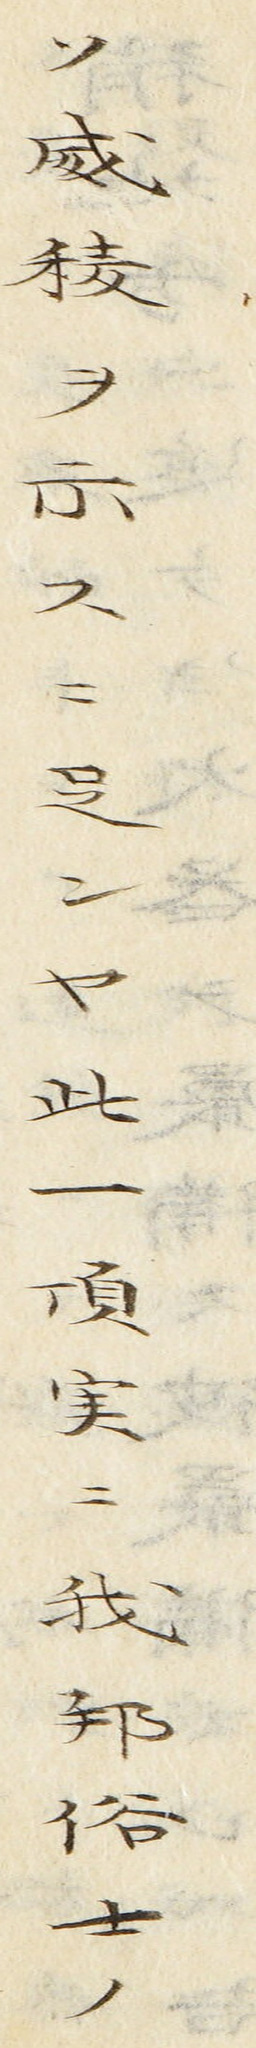ソ威稜ヲ示スニ足ンヤ此一頂実ニ我邦俗士ノ
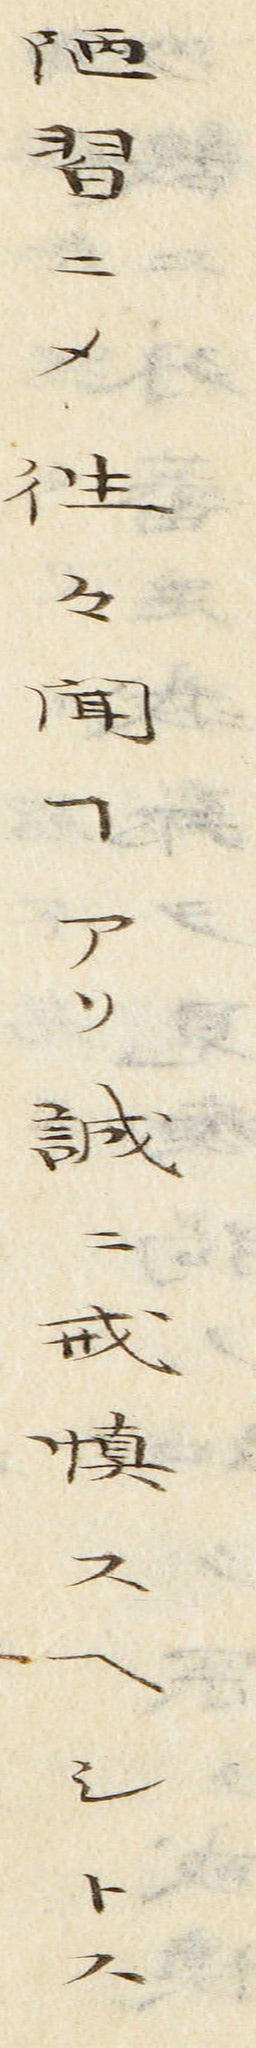陋習ニシテ往々聞コトアリ誠ニ戒慎スヘシトス
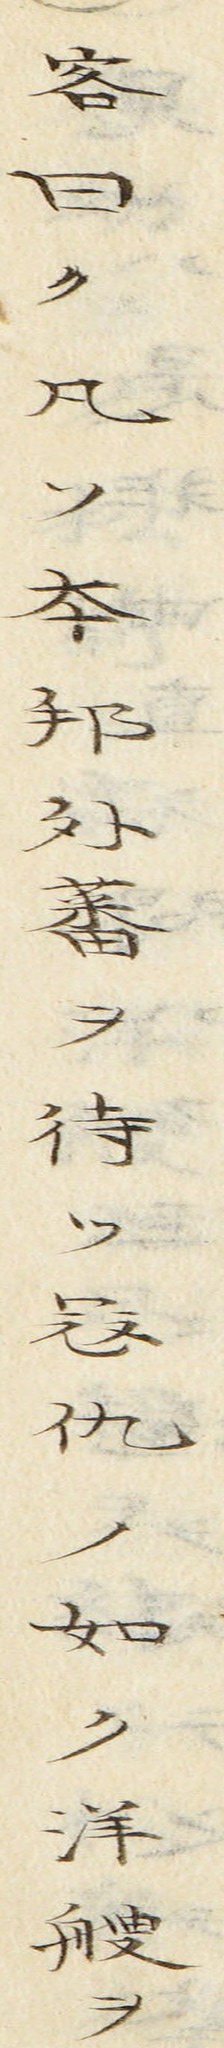〇客曰ク凡ソ本邦外蕃ヲ待ツ寇仇ノ如ク洋艘ヲ

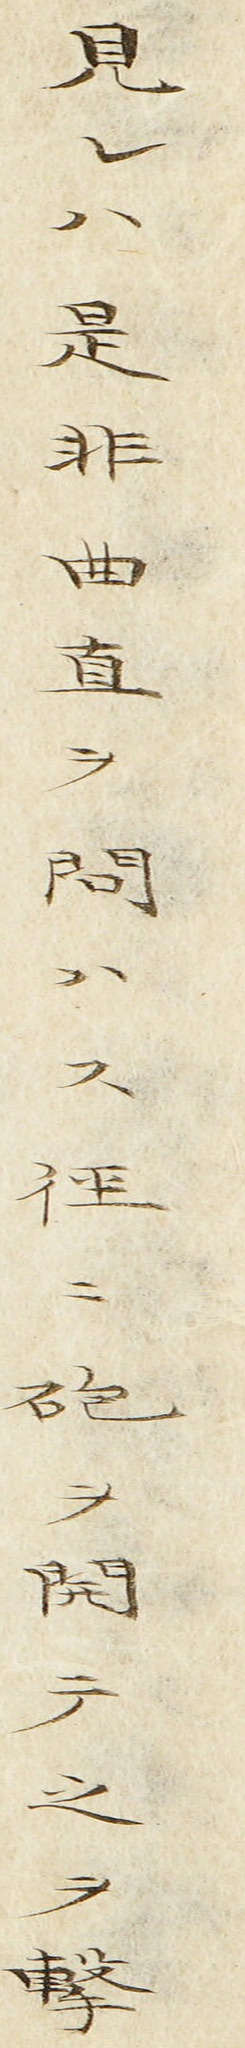見レハ是非曲直ヲ問ハス径ニ砲ヲ開テ之ヲ撃
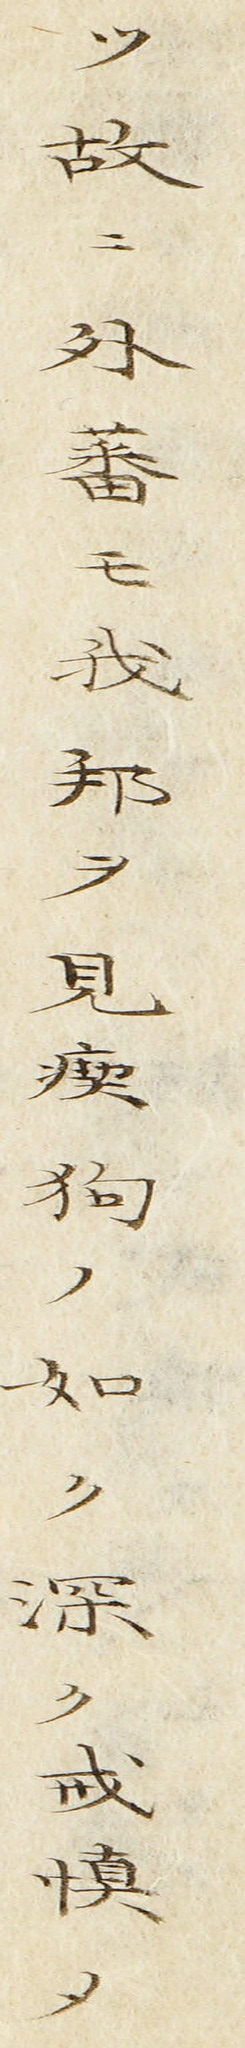ツ故ニ外蕃モ我邦ヲ見瘈狗ノ如ク深ク戒シテ
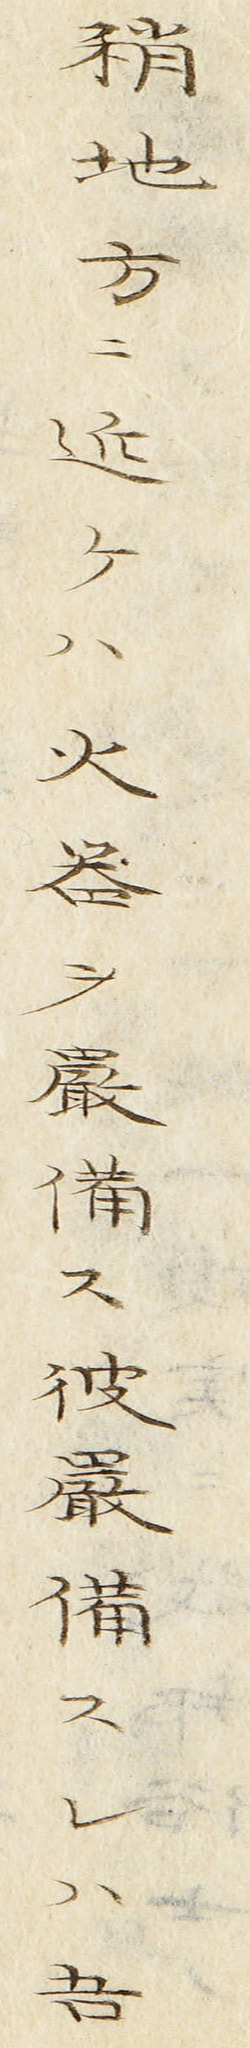稍地方ニ近ケハ火器ヲ嚴備ス彼嚴備スレハ吾
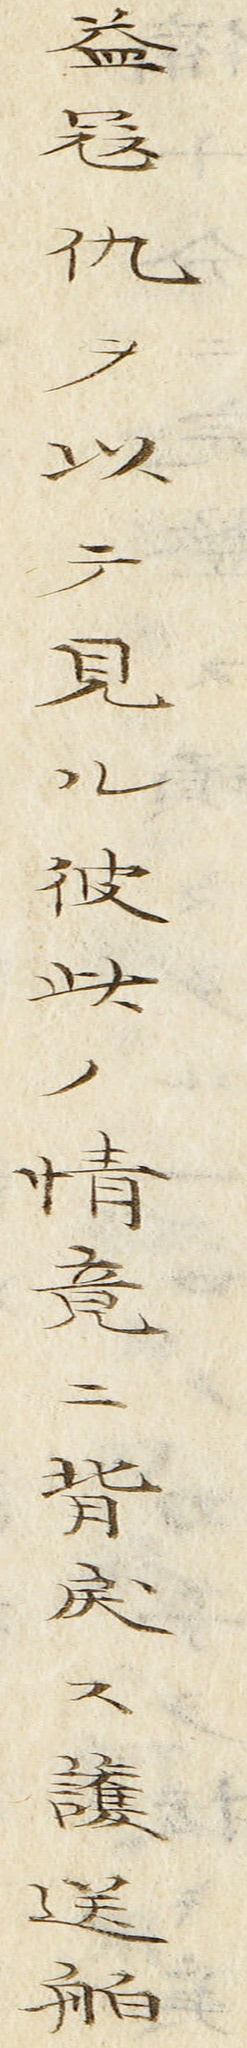益寇仇ヲ以テ見ル彼此ノ情竟ニ背戻ス護送舶
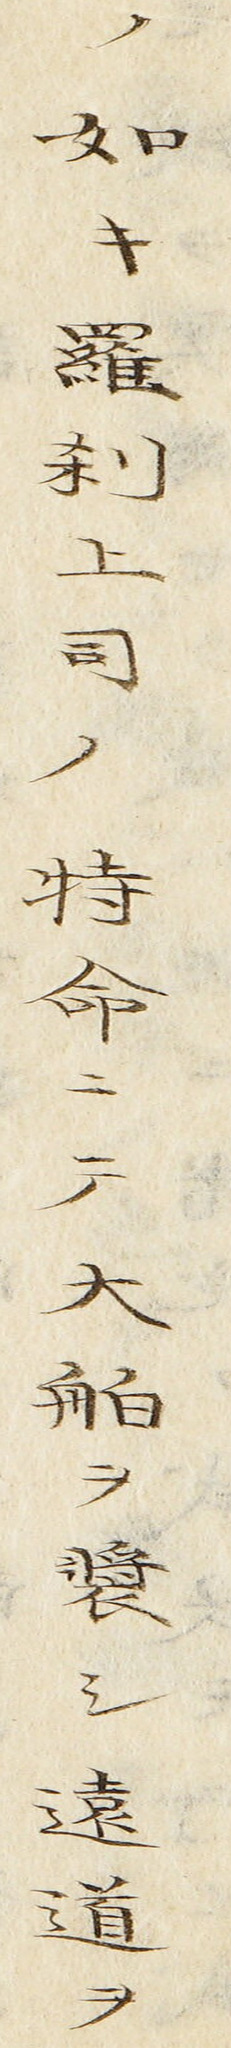ノ如キ羅刹上司ノ特命ニテ大舶ヲシ遠道ヲ
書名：蕃談
